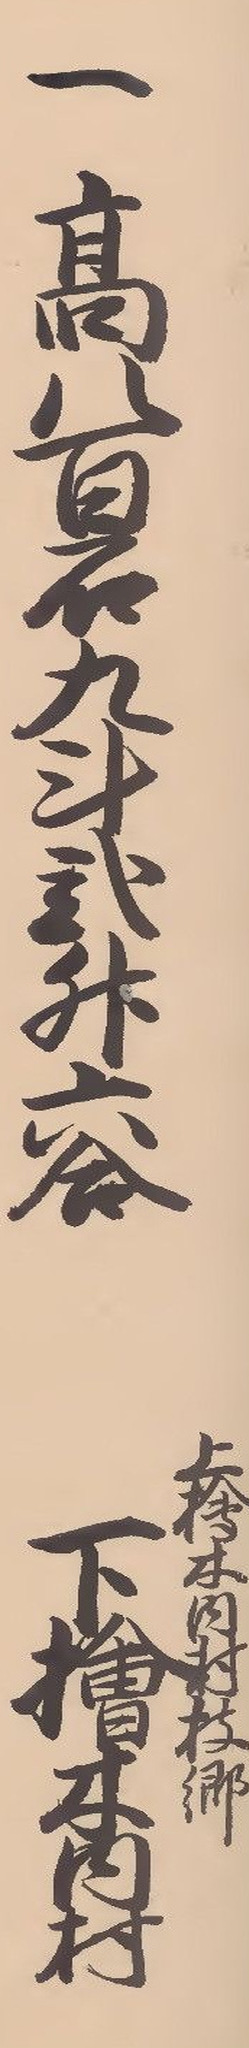一高八百石九斗弐升六合下桧木内村
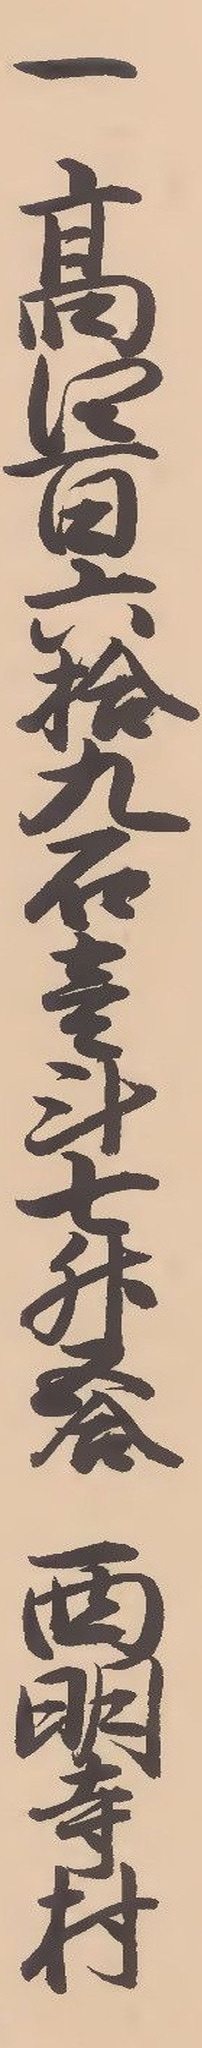一高四百六拾九石壱斗七升五合西明寺村
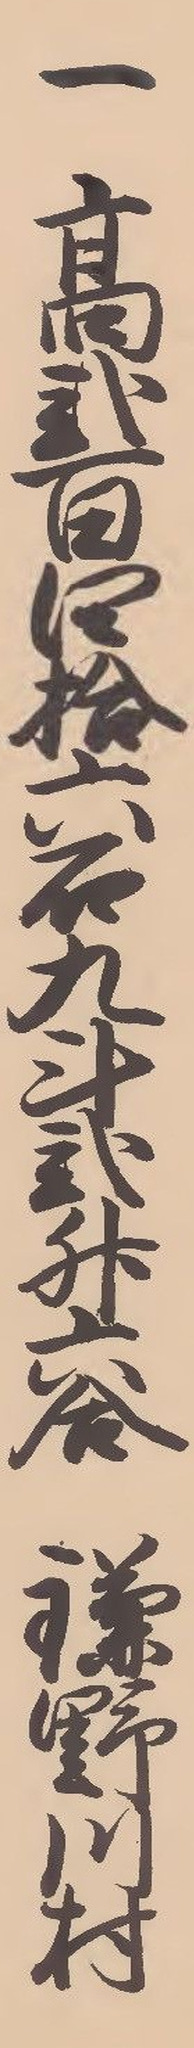一高弐百四拾六石九斗弐升六合鎌野川村
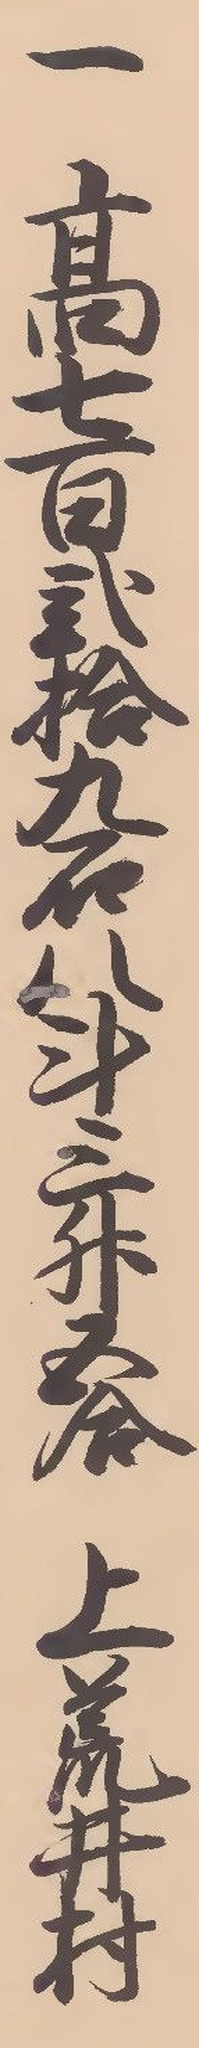一高七百弐拾九石八斗三升五合上荒井村

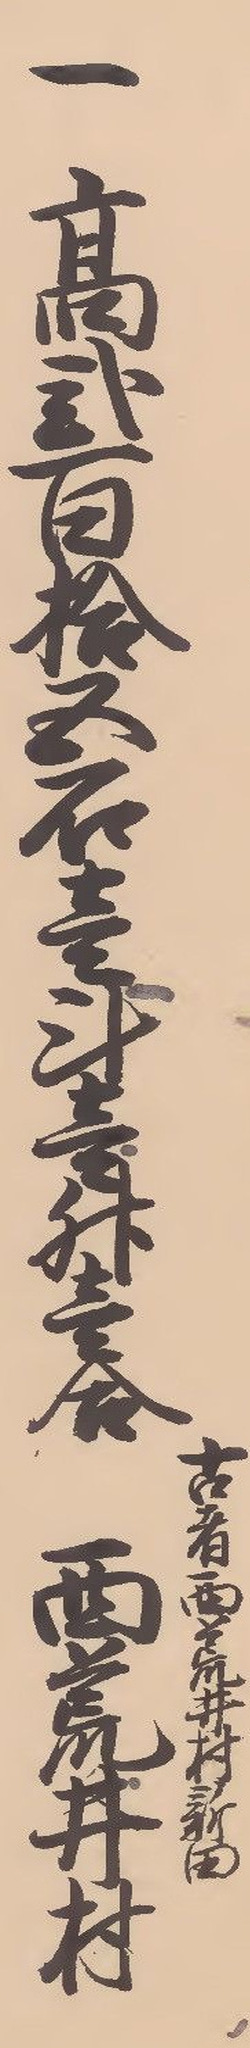一高弐百拾五石壱斗壱升壱合西荒井村
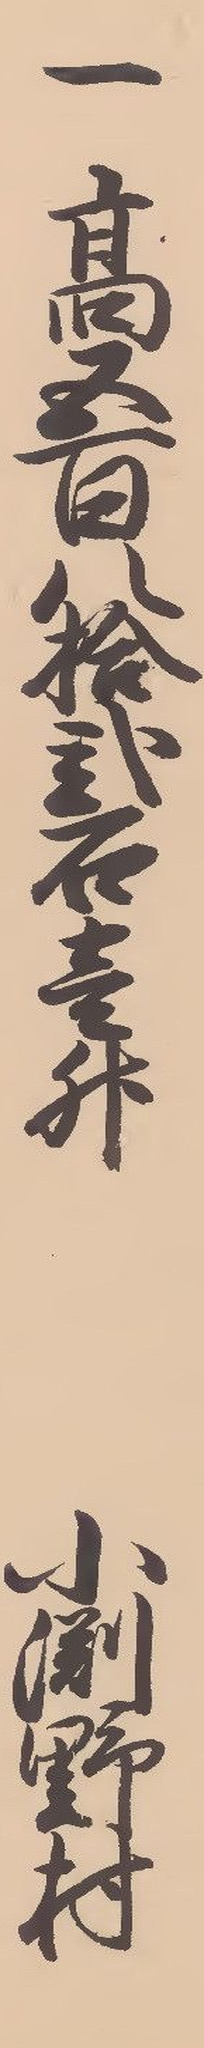一高五百八拾弐石壱升小淵野村
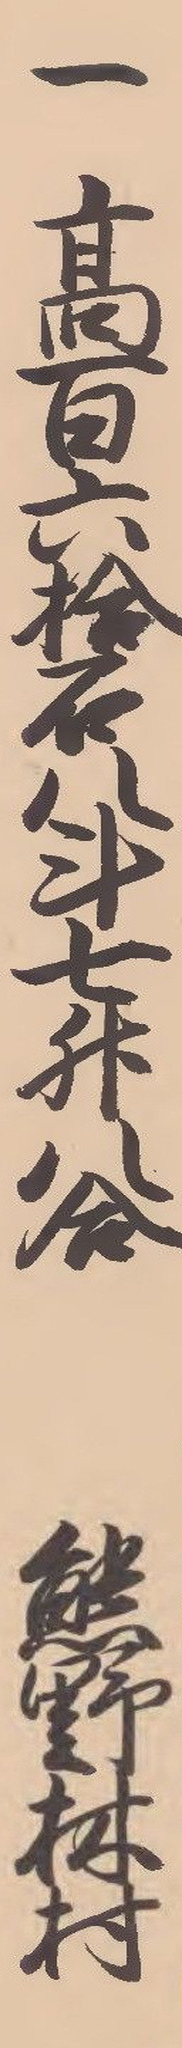一高百六拾石八斗七升八合熊野林村
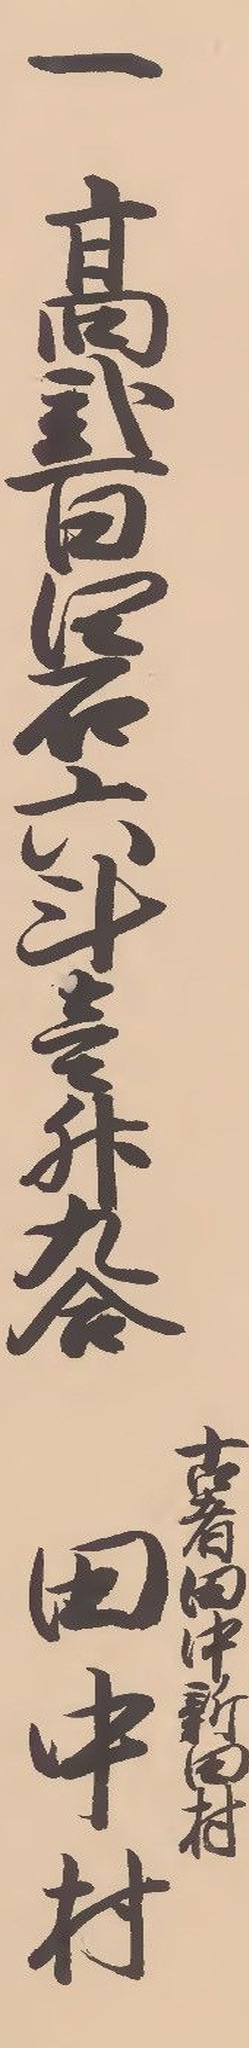一高弐百四石六斗壱升九合田中村
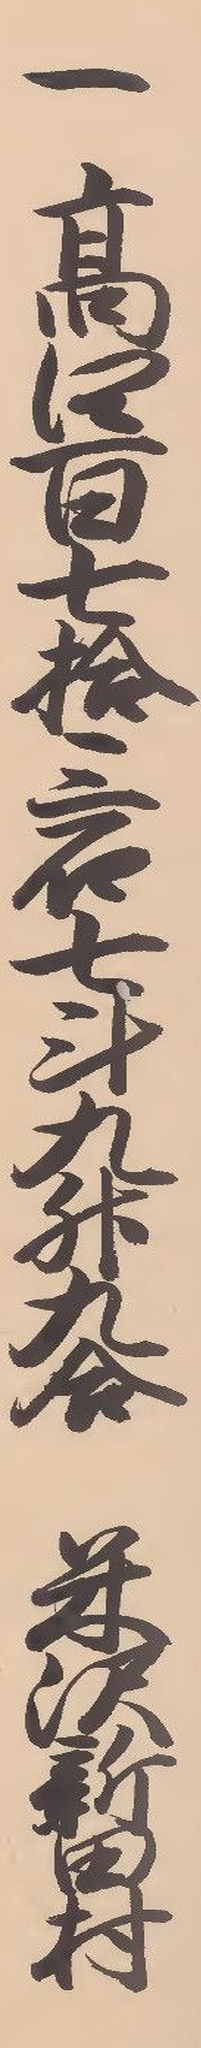一高四百七拾三石七斗九升九合米沢新田村
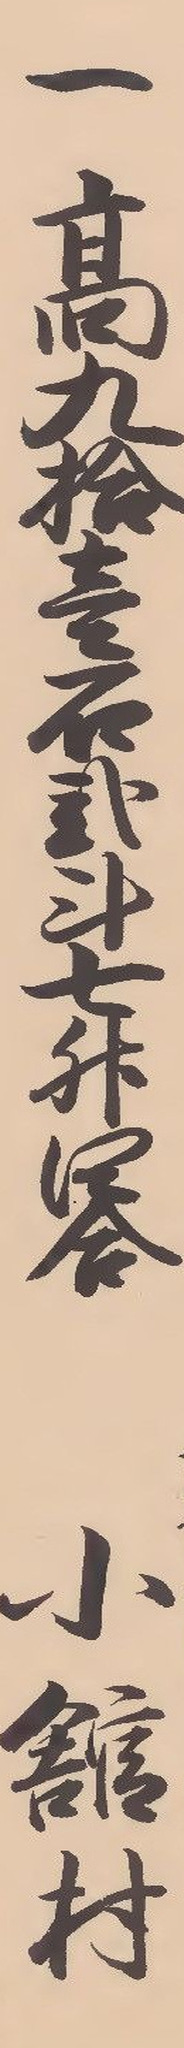一高九拾壱石弐斗七升四合小館村
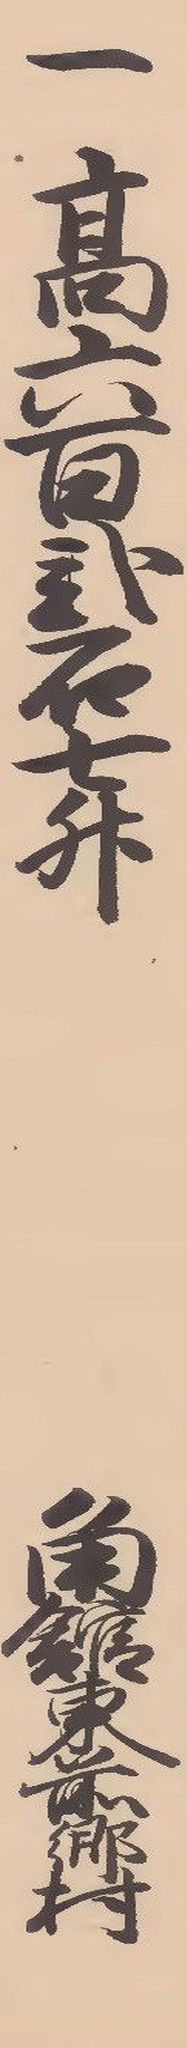一高六百弐石七升角館東前郷村
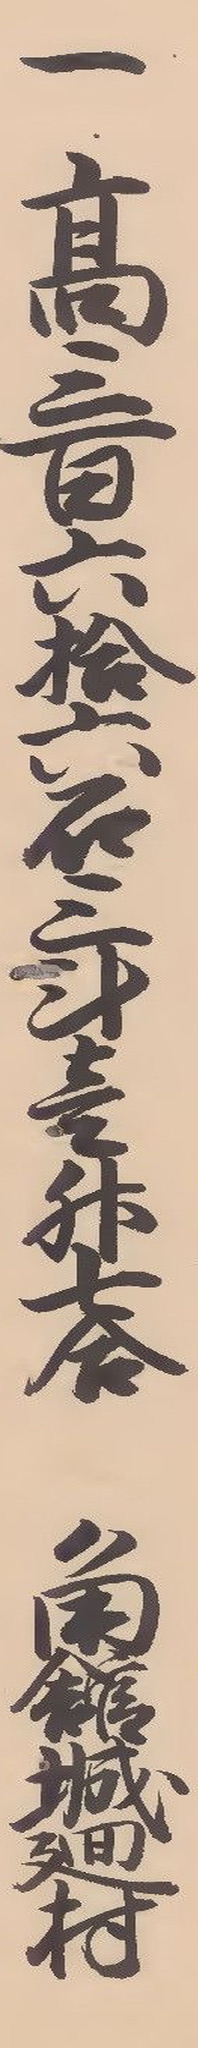一高三百六拾六石三斗壱升七合角館城廻村

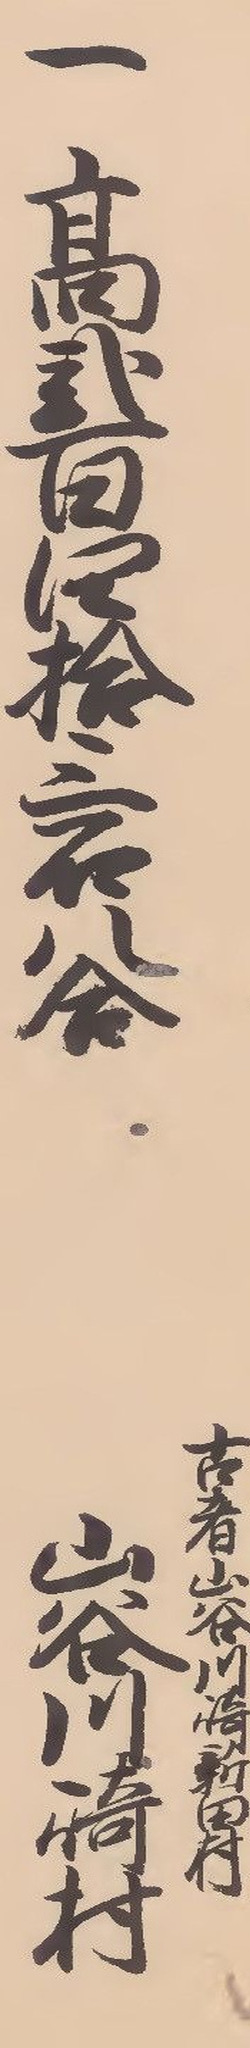一高弐百四拾三石八合山谷川崎村
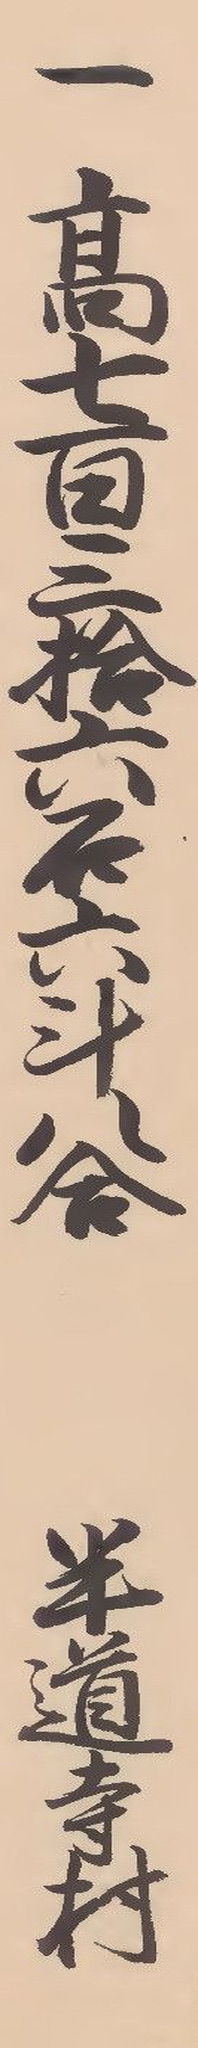一高七百三拾六石六斗八合半道寺村
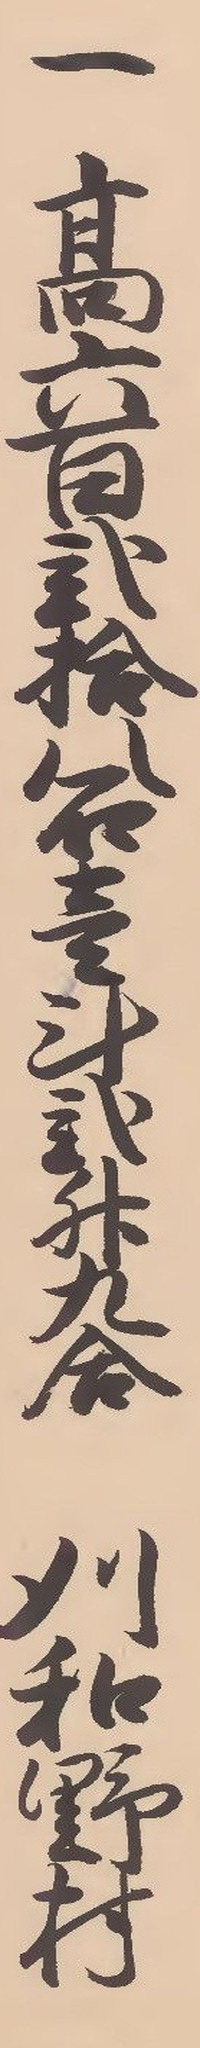一高六百弐拾八石壱斗弐升九合刈和野村
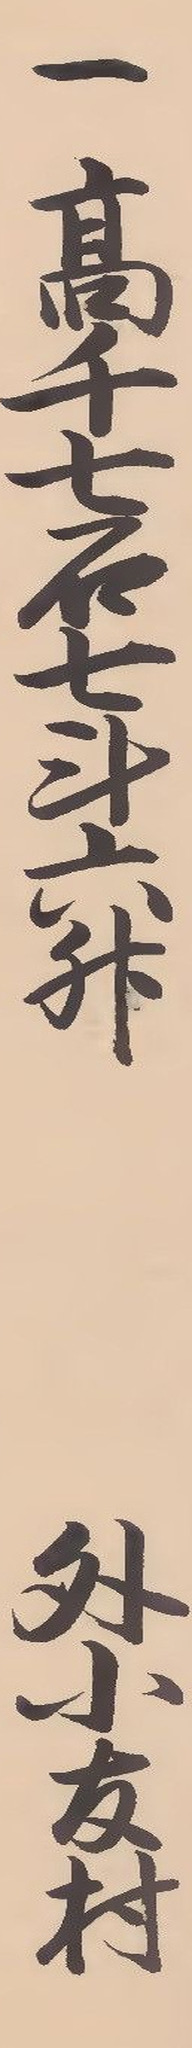一高千七石七斗六升外小友村
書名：出羽国郷帳　５
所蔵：国立公文書館 National Archives of Japan
